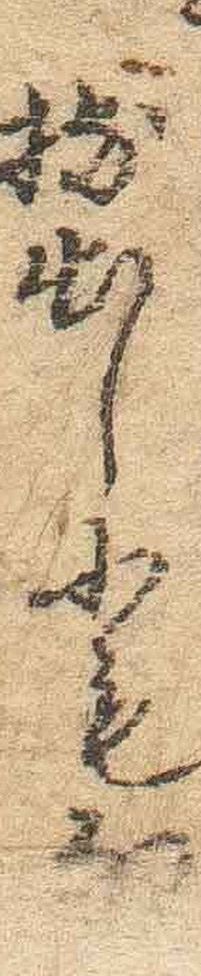持出しにもなる

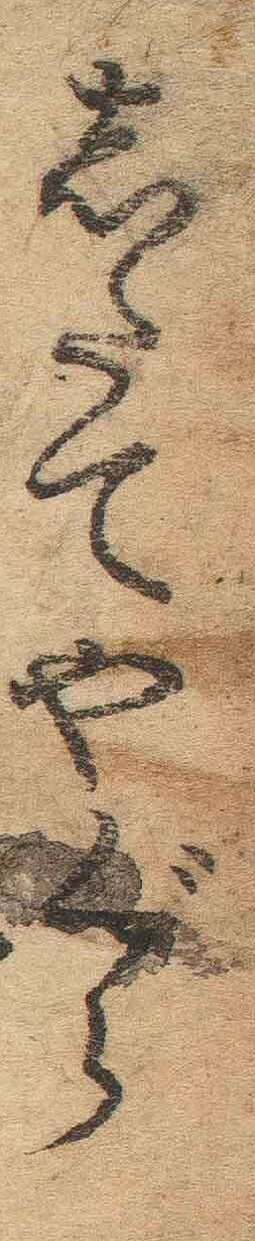したてやぐら
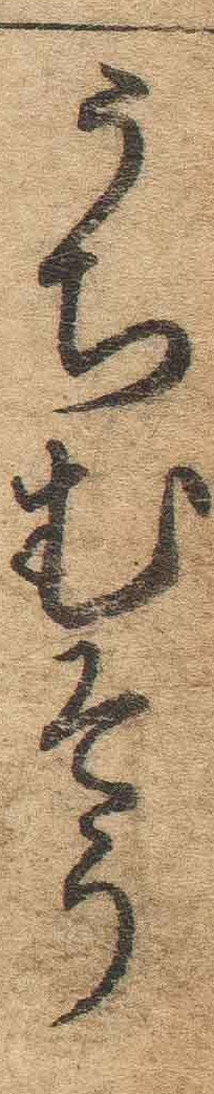うちむそう
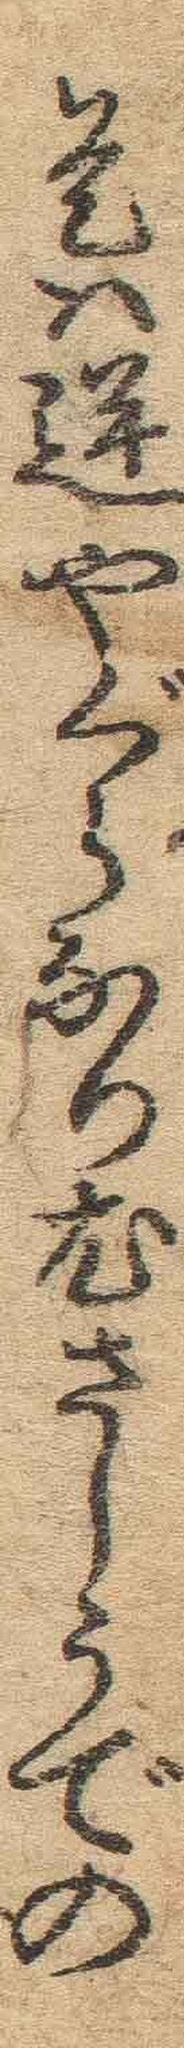是は逆やぐらなり尤さしうでの
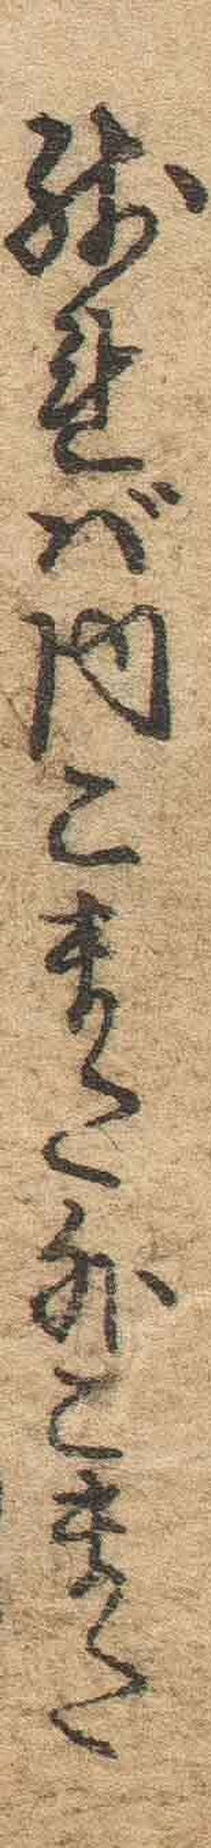残れば内こまた外こまた
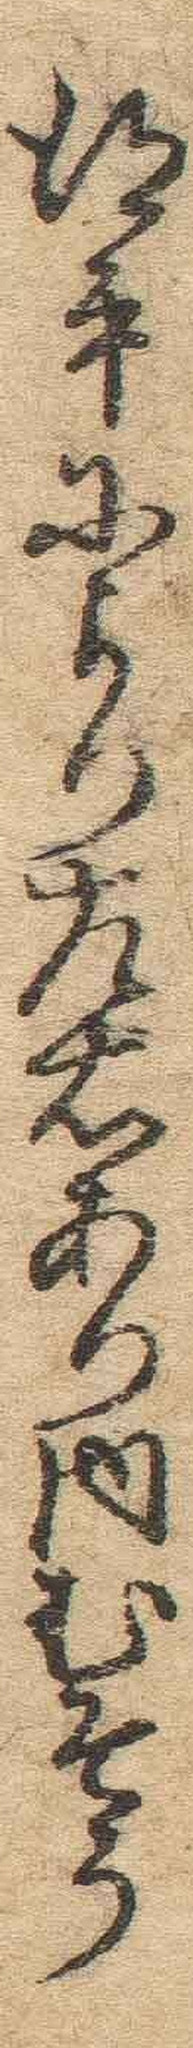得手により左右あり内むそう
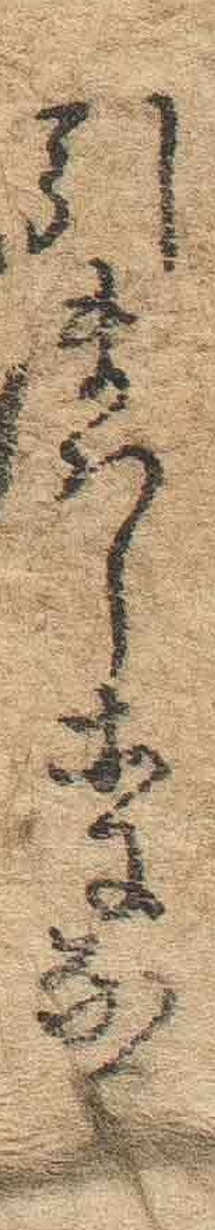引まはし等になる
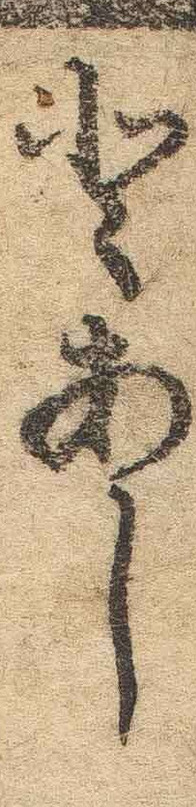登あし
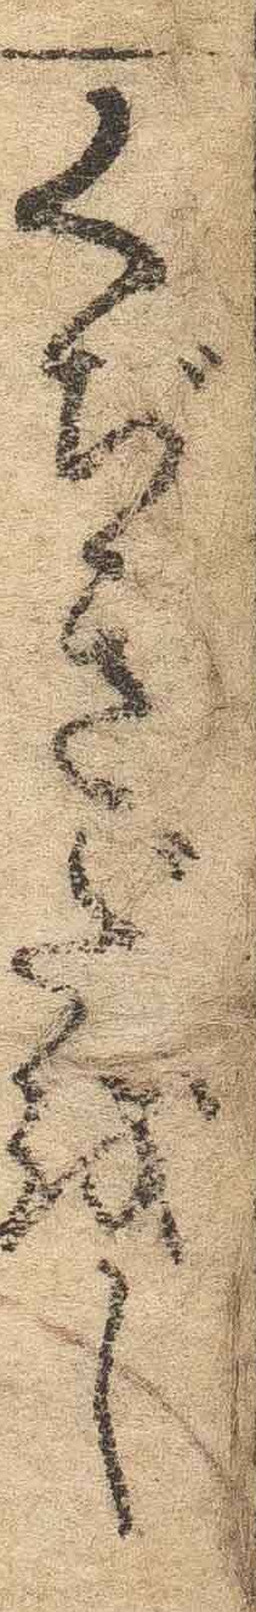くぢきだをし
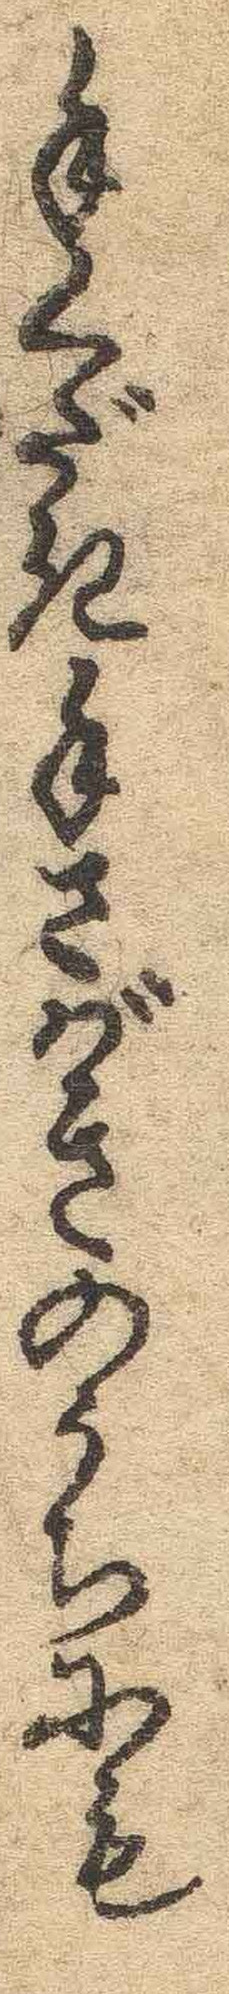手くだき手ささばきのうちに
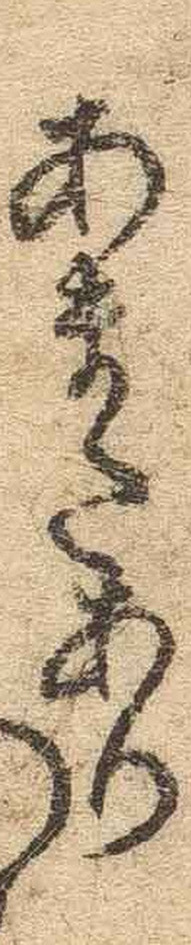あまたあり
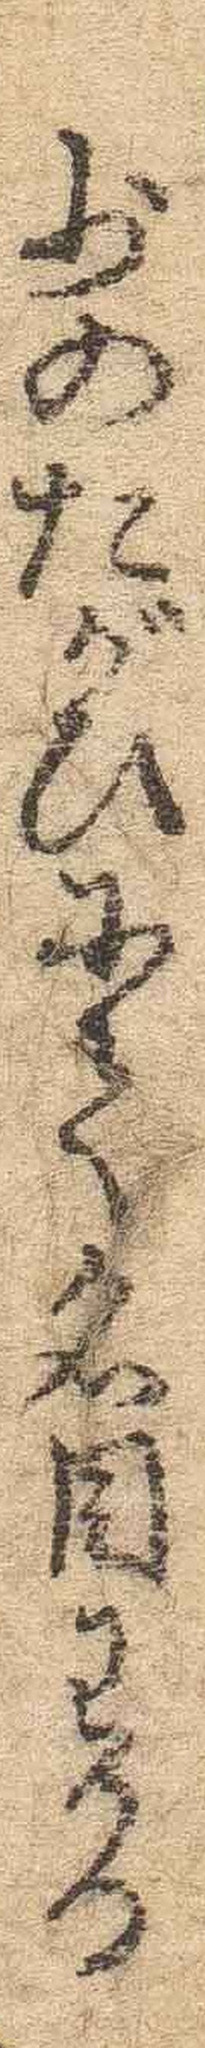少のたがひにて名目わかる

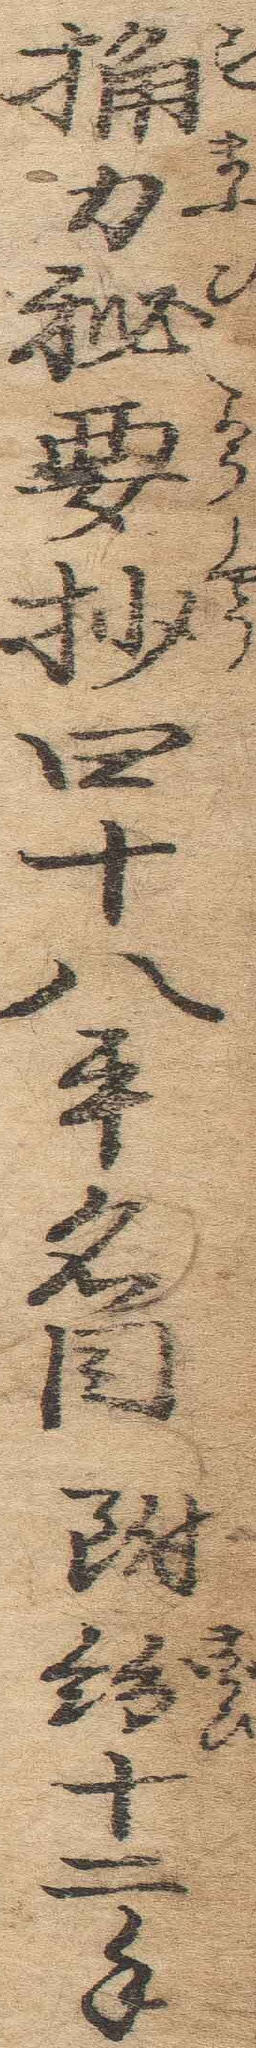捔力秘要抄四十八手名目附紛十二手
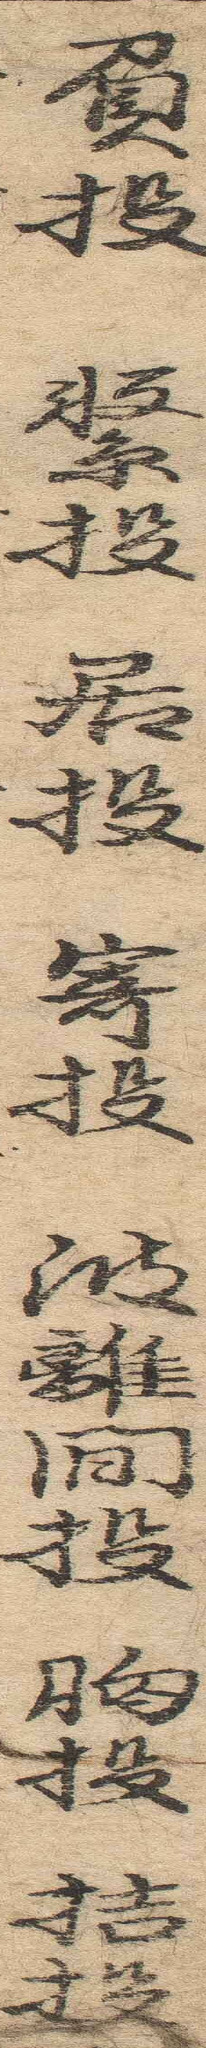負投繋投居投寄投波離間投胸投拮投
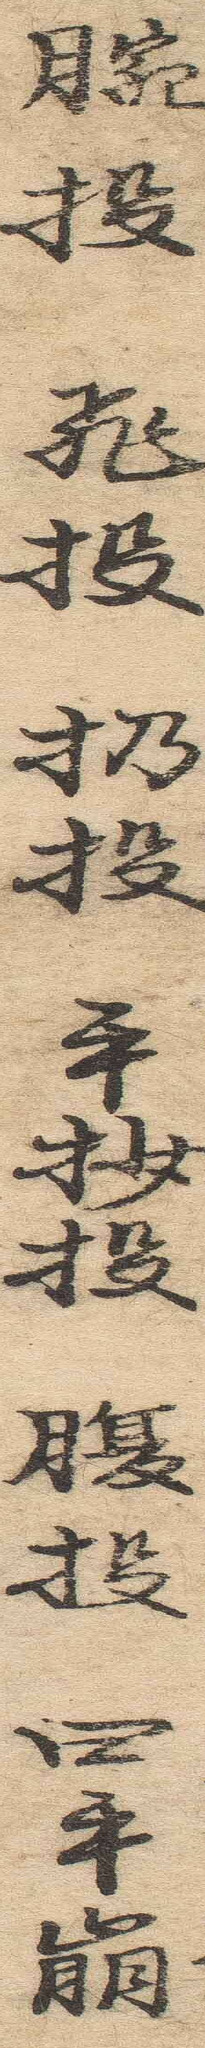腕投飛投扔投手抄投腹投四手崩
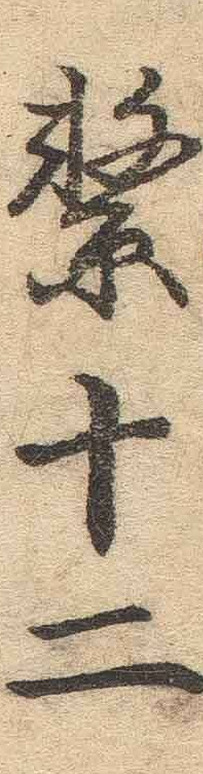投十二
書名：古今相撲大全
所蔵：東京学芸大学附属図書館 国文学研究資料館
